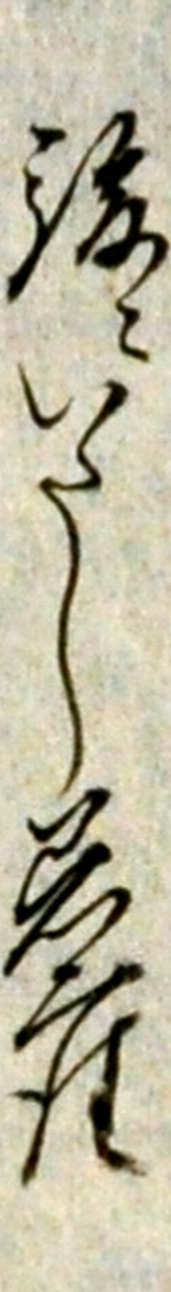後ニいたし着座
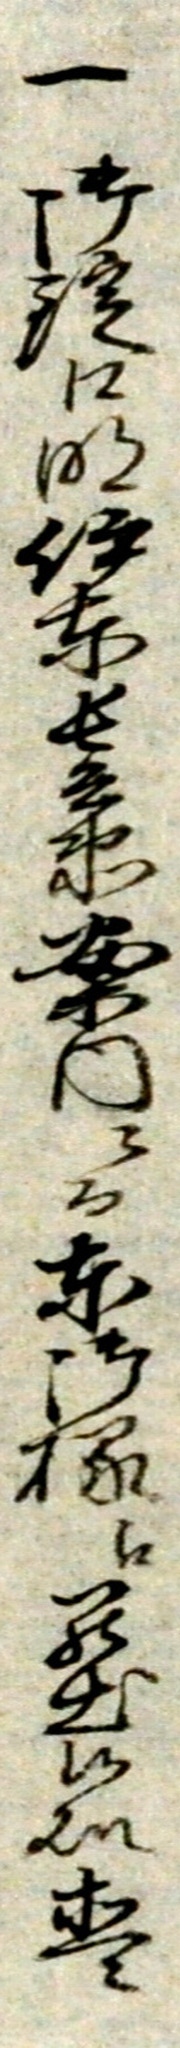一御錠口明伊東長兵衛案内ニ而東御縁江罷出候処直ニ
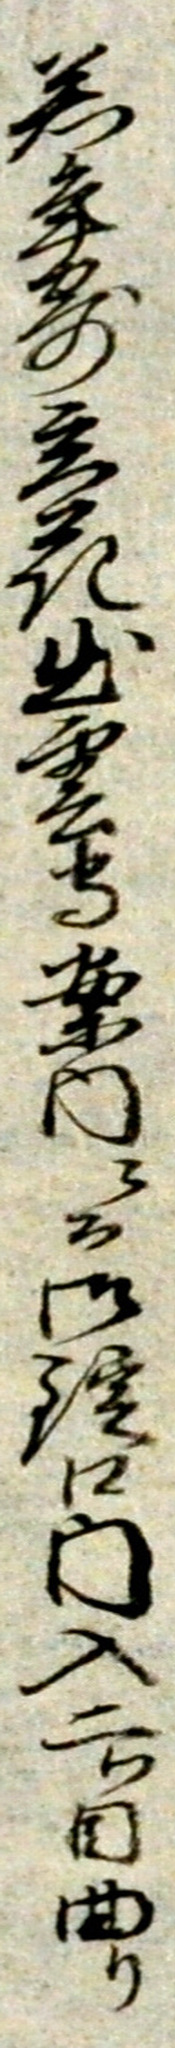若年寄立花出雲守案内ニ而御錠口内入二ツ目曲り
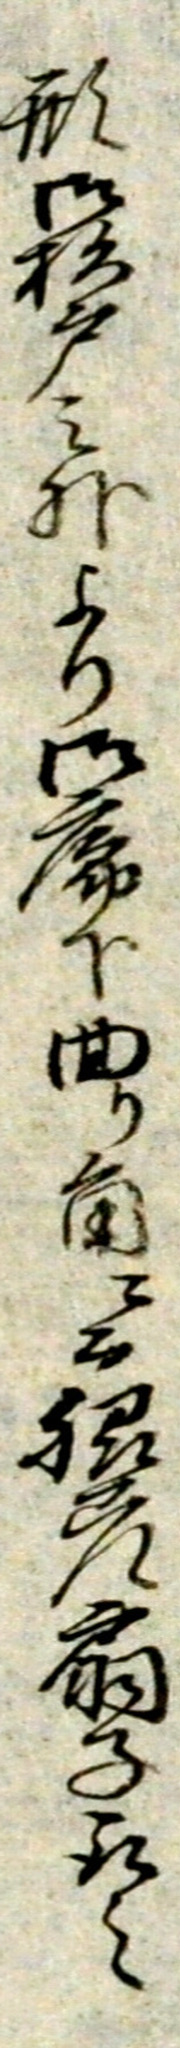形御杉戸之外より御廊下曲り角ニ而脇差扇子取之
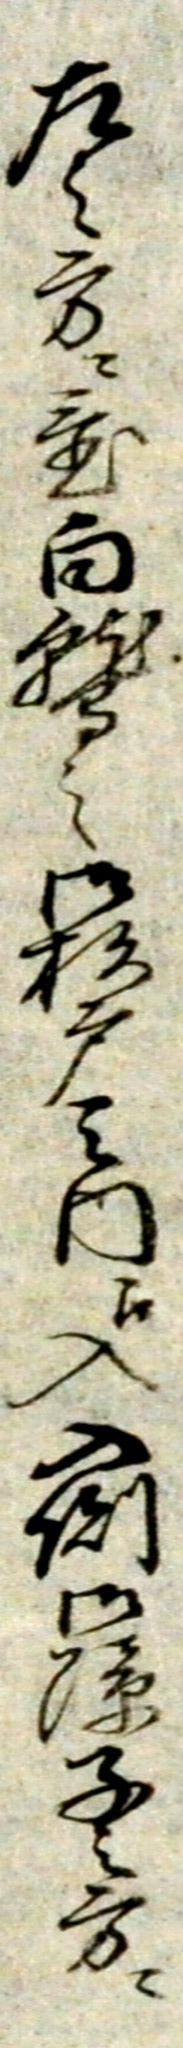左之方ニ置白鷲之御杉戸之内江入入側御障子之方ニ
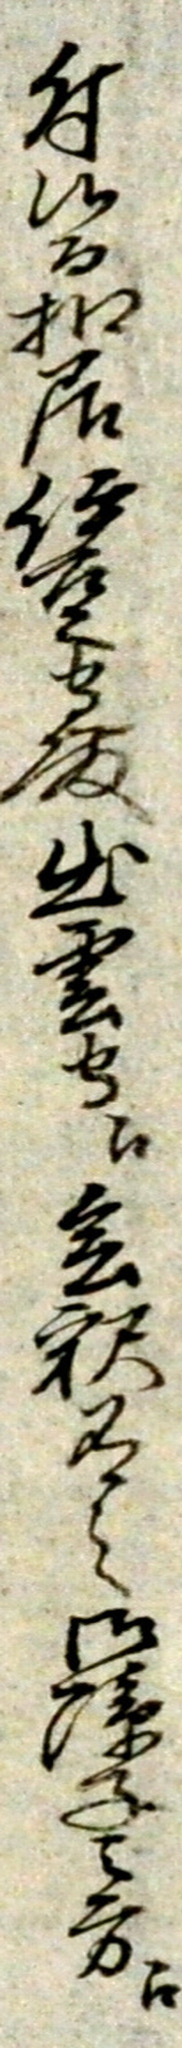付候而扣居伊豆守殿出雲守江会釈有之御障子之方江
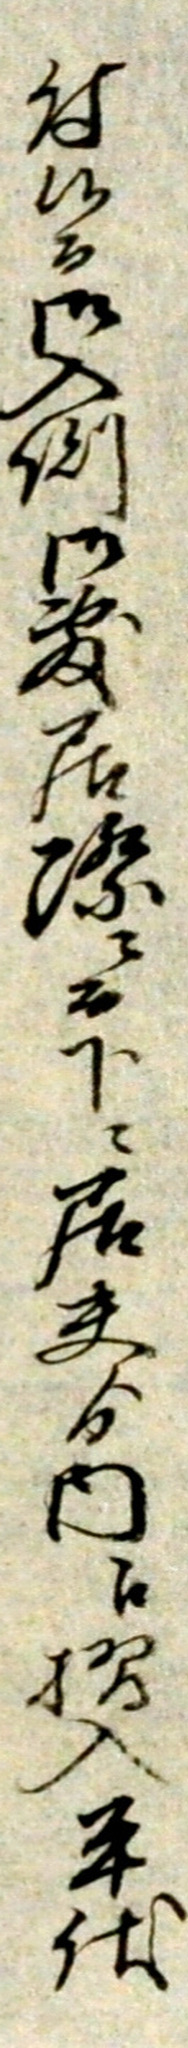付候而御入側御敷居際ニ而下ニ居夫ゟ内江摺入平伏
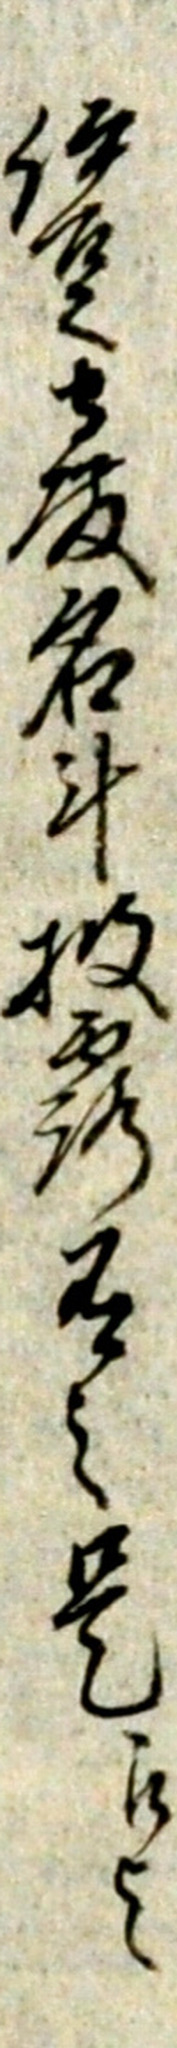伊豆守殿名計披露有之是江と
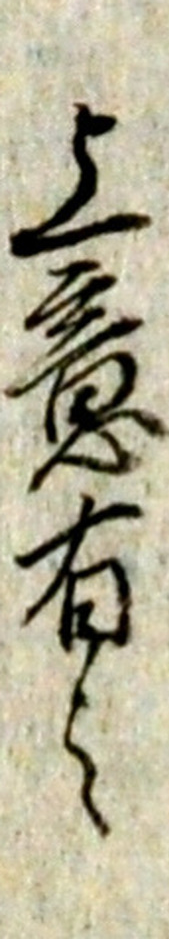上意有之
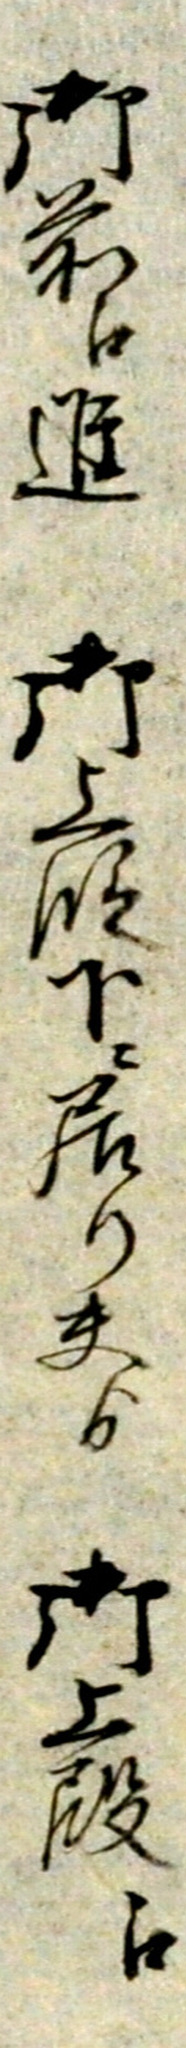御前江進御上段下ニ居り夫ゟ御上段え
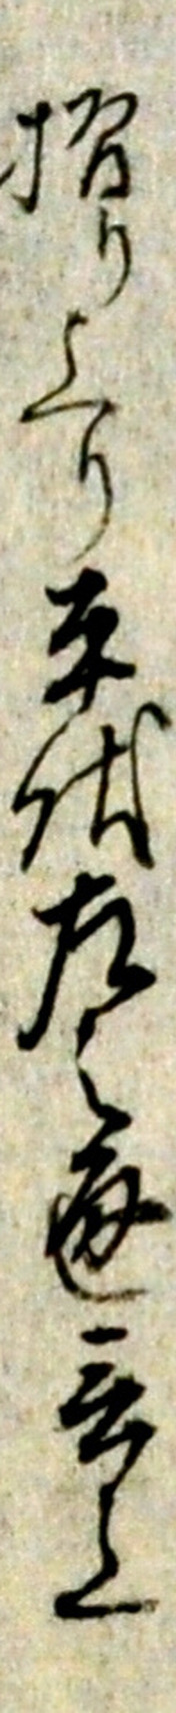摺り上り平伏左之通言上
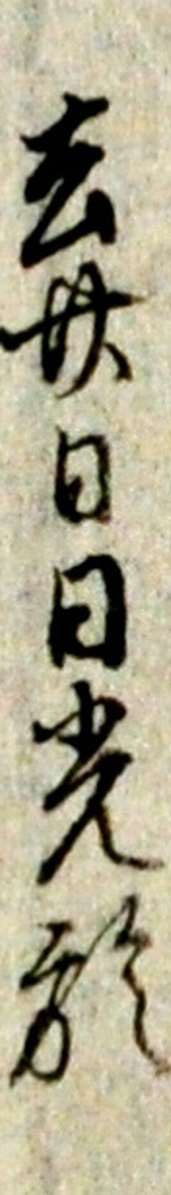去廿日日光於
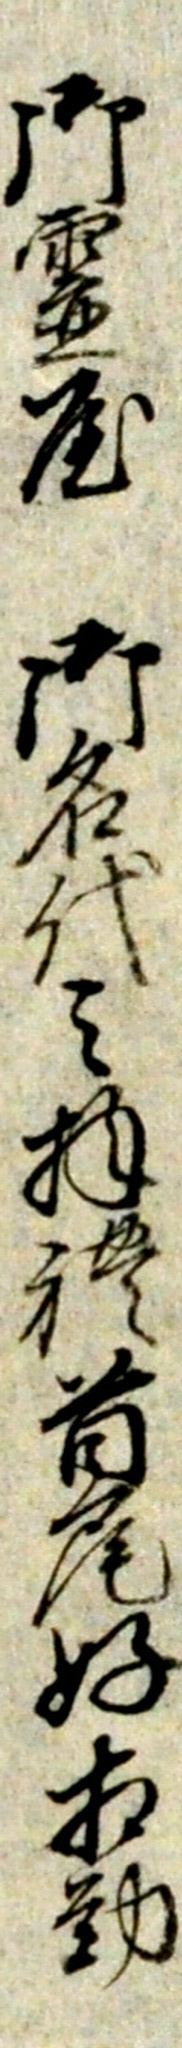御霊屋御名代之拝礼首尾好相勤
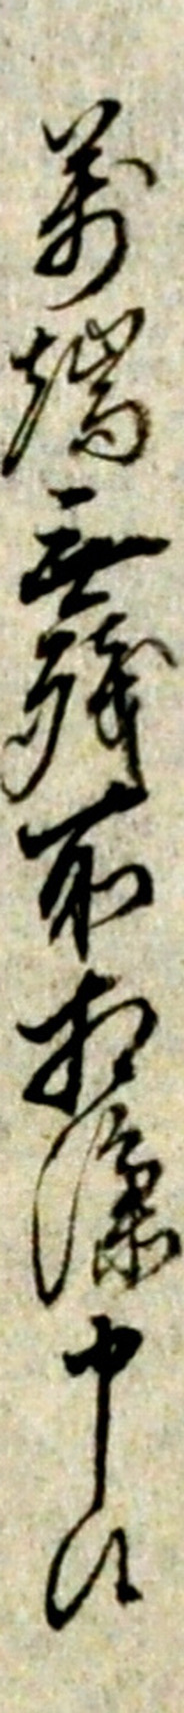万端無残所相済申候
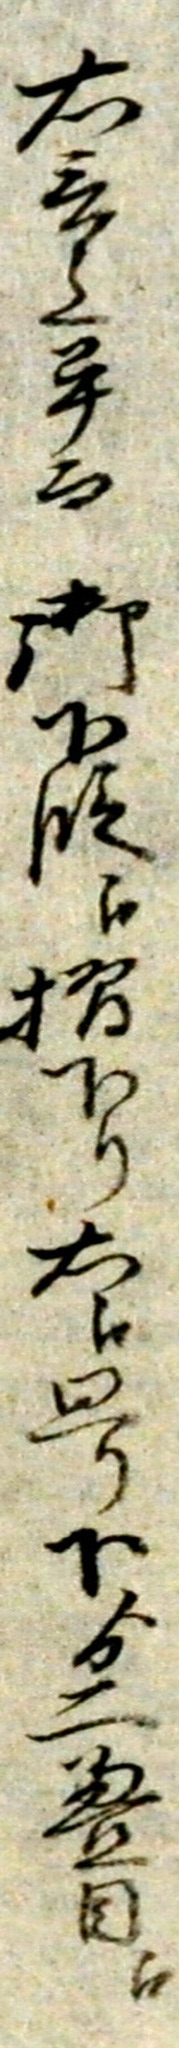右言上畢而御下段江摺下り右江廻り下ゟ二畳目江
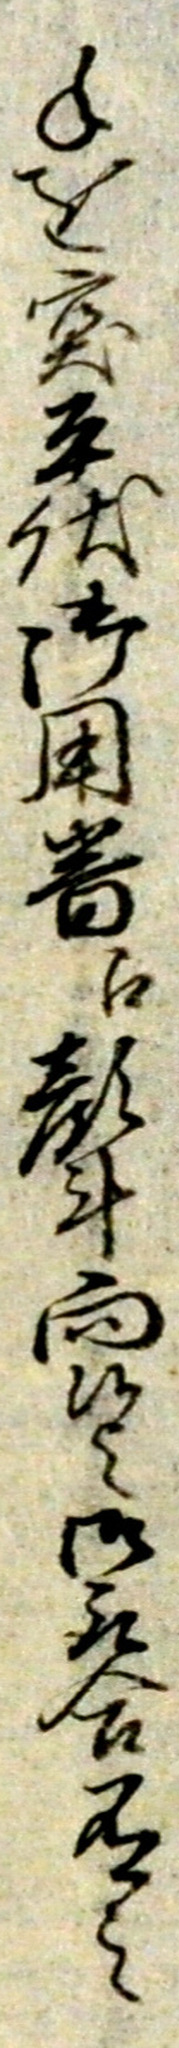手を突平伏御用番江顔計向候と御取合有之
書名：日光御名代相勤候節ノ留
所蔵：伊那市立高遠町図書館・合同会社AMANE
